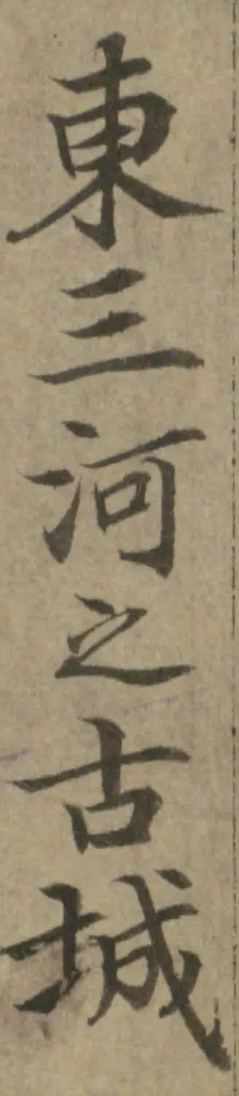東三河之古城

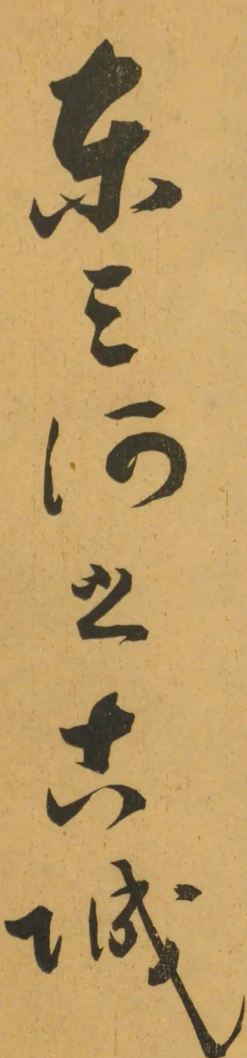東三河之古城

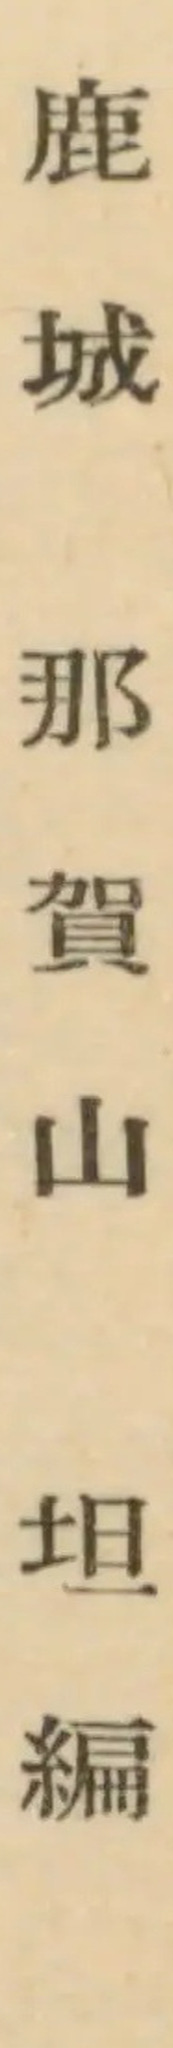鹿城那賀山坦編
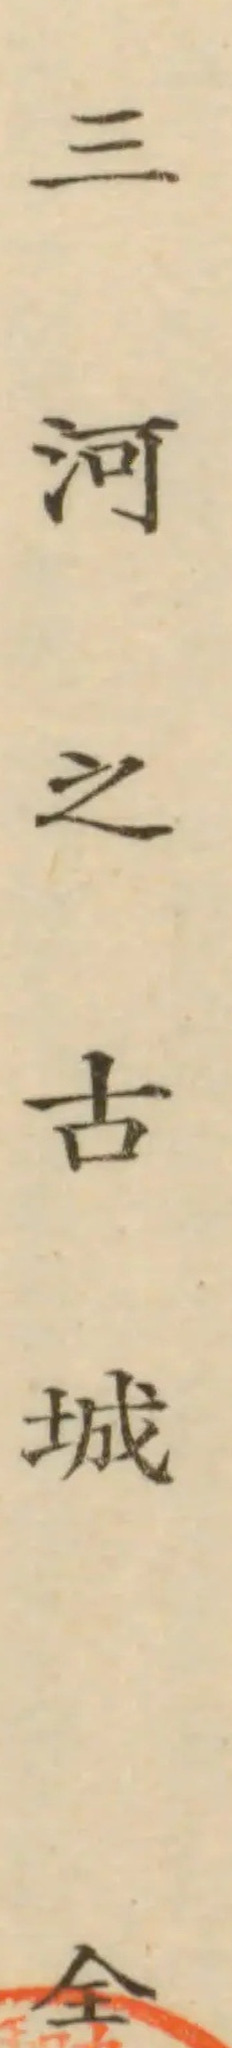東三河之古城全

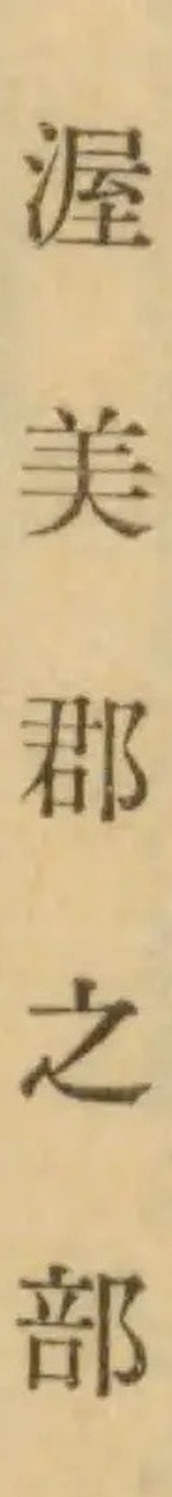渥美郡之部
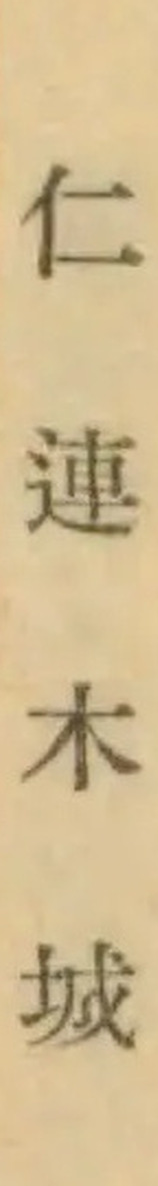仁連木城
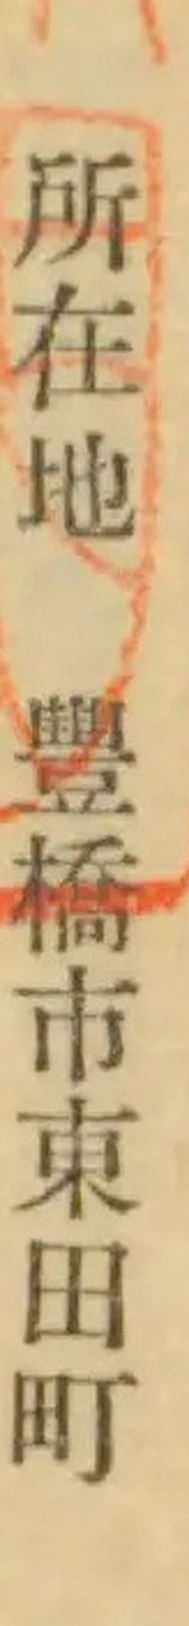所在地豊橋市東田町
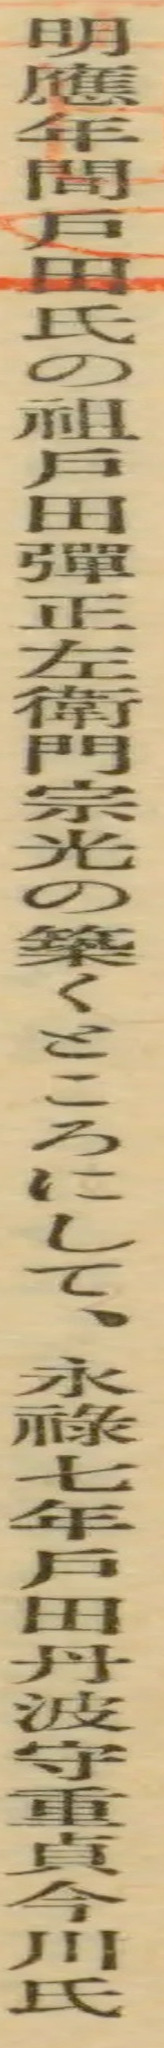明応年間戸田氏の祖戸田弾正左衛門宗光の築くところにして、永禄七年戸田丹波守重貞今川氏
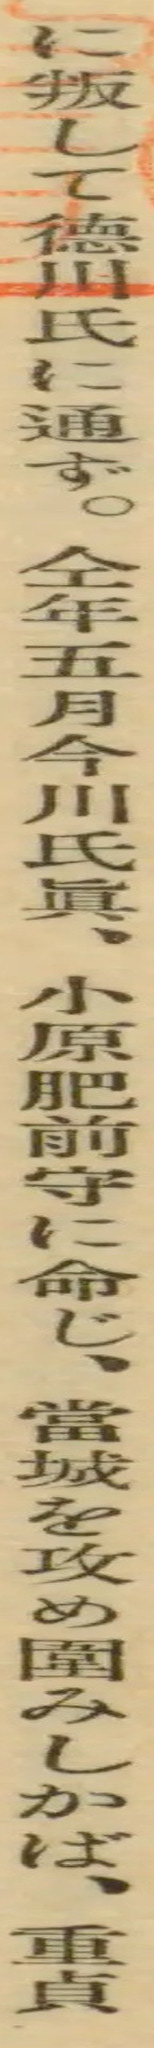に叛して徳川氏に通ず。仝年五月今川氏眞、小原肥前守に命じ、当城を攻め囲みしかば、重貞
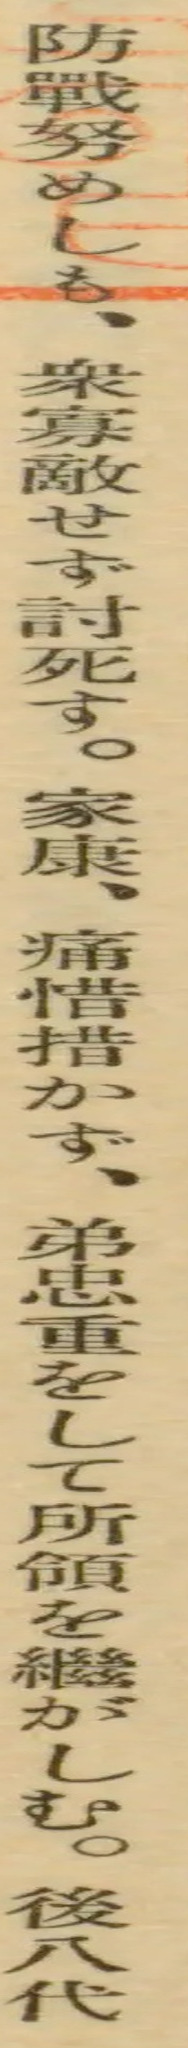防戦努めしも、衆寡敵せず討死す。家康、痛惜措かず、弟忠重をして所領を継がしむ。後八代
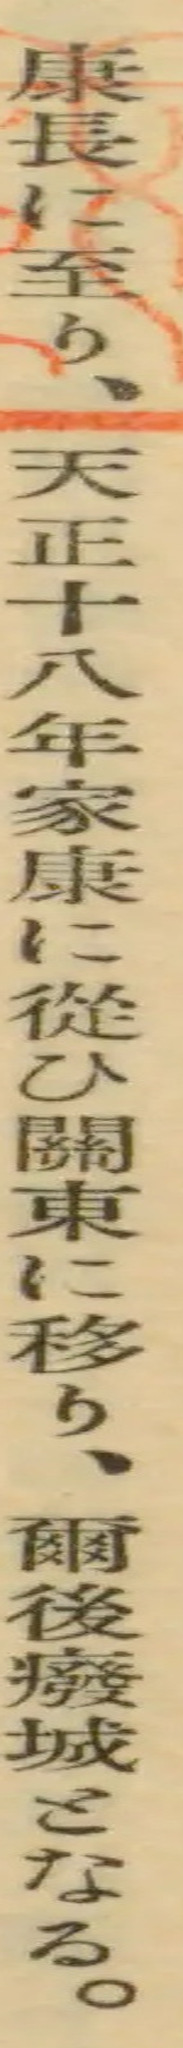康長に至り、天正十八年家康に従ひ関東に移り、爾後廃城となる。
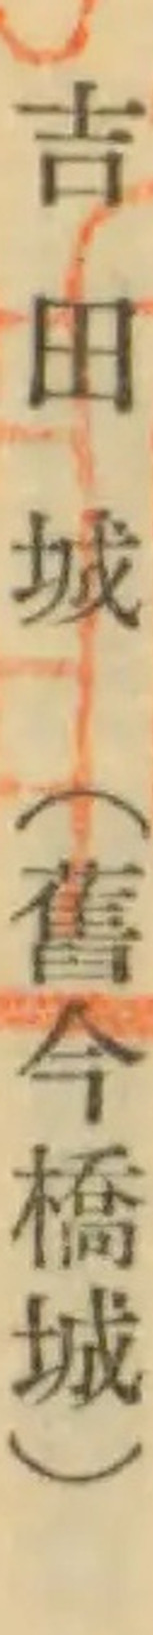吉田城(旧今橋城)
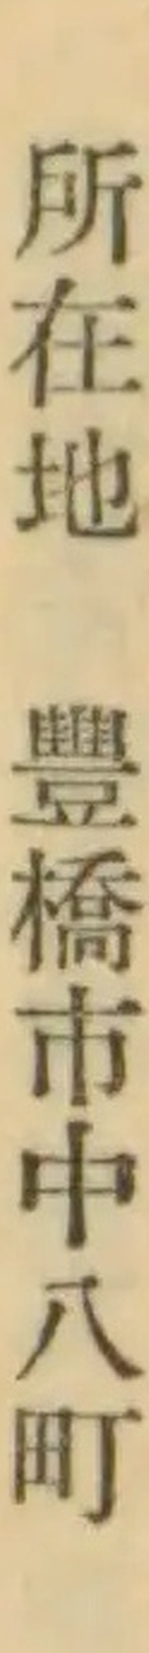所在地豊橋市中八町
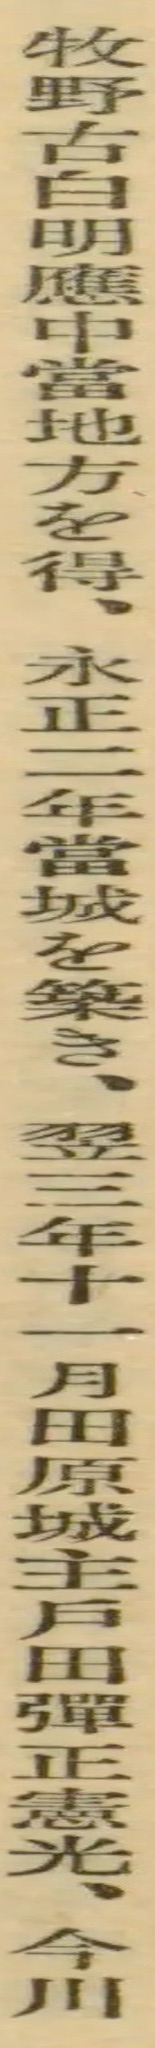牧野古白明応中当地方を得、永正二年当城を築き、翌三年十一月田原城主戸田弾正憲光、今川
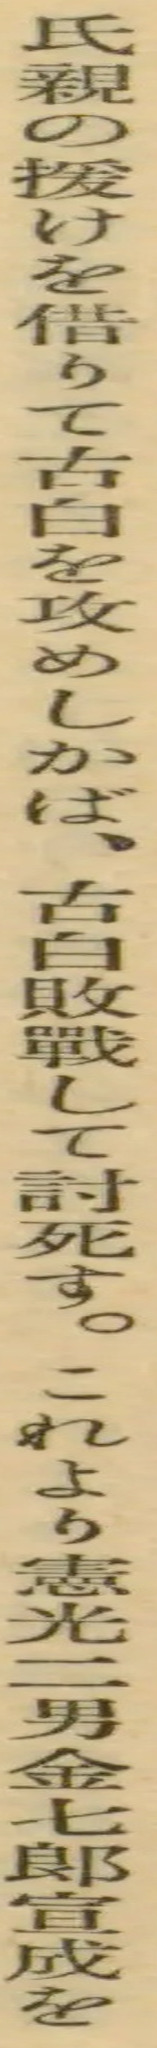氏親の援けを借りて古白を攻めしかば、古白敗戦して討死す。これより憲光二男金七郎宣成を
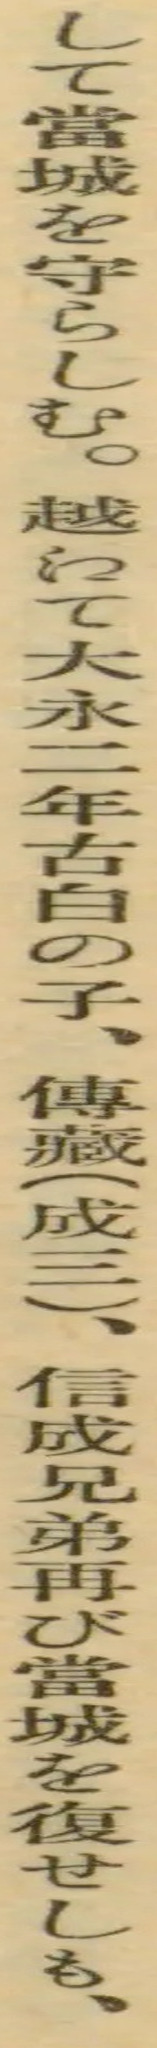して当城を守らしむ。越えて大永二年古白の子、伝蔵(成三)、信成兄弟再び当城を復せしも、
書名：東三河之古城
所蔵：国立国会図書館 National Diet Library, JAPAN
